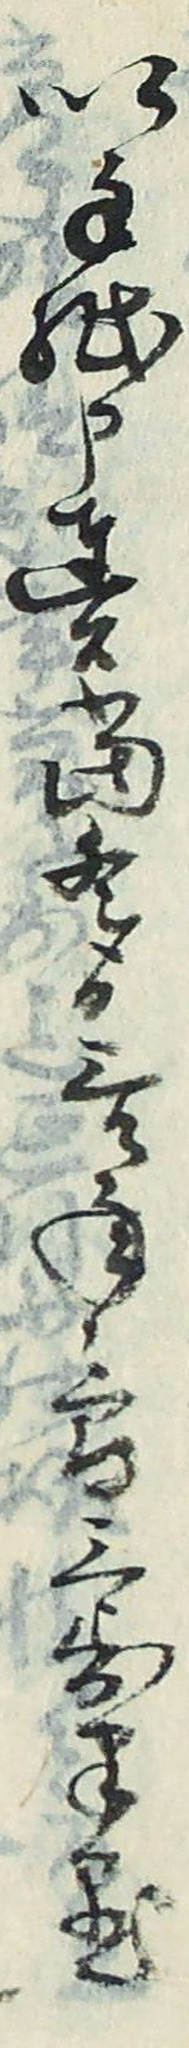以手紙申達候當冬ゟ三ケ年之間三歩半懸
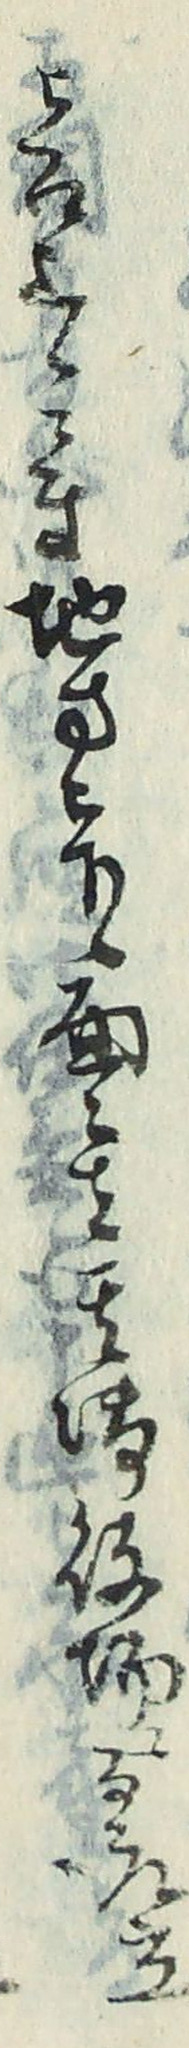被召上候ニ付地方被下候面々者其御役場ニ而取立
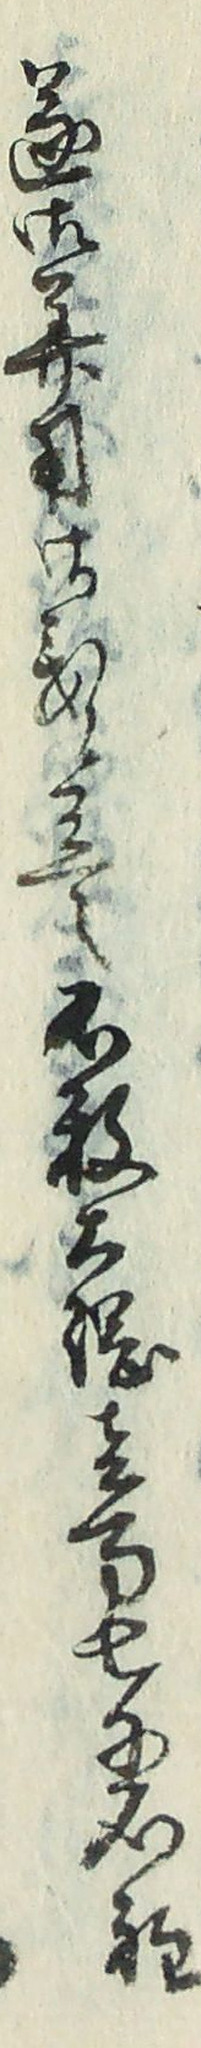遂御算用御義ニ有之石数大綱壱万七千石程
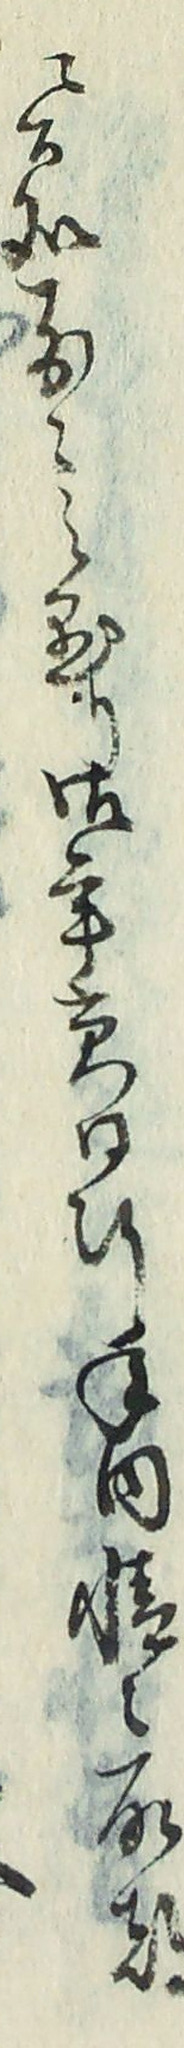ニ而処別々之懸り御年貢同断年内情々取都
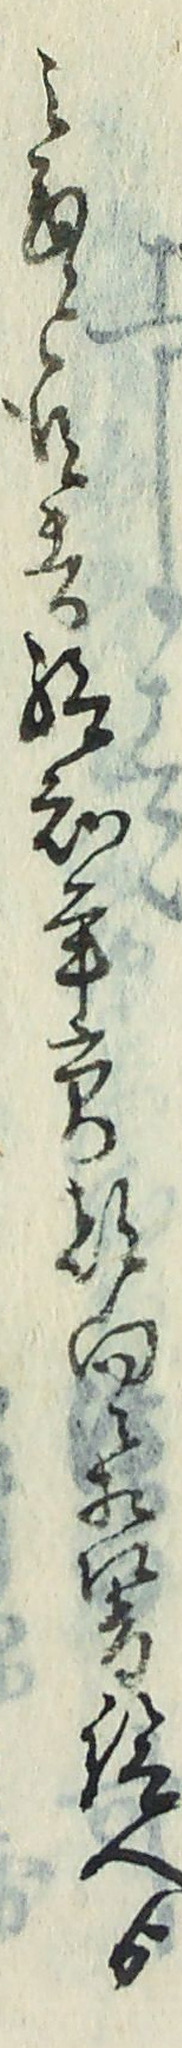之義ニ候得共給知年貢都向ニ相響給人ゟ
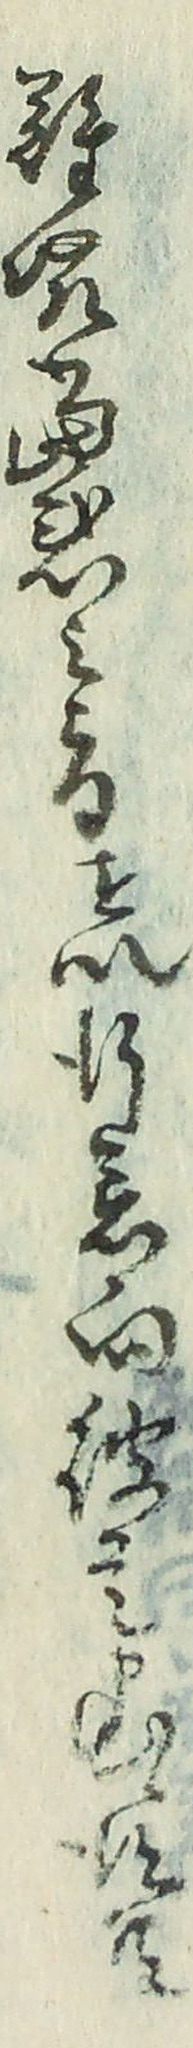難渋當惑之旨を以て行着向彼是申出候得共
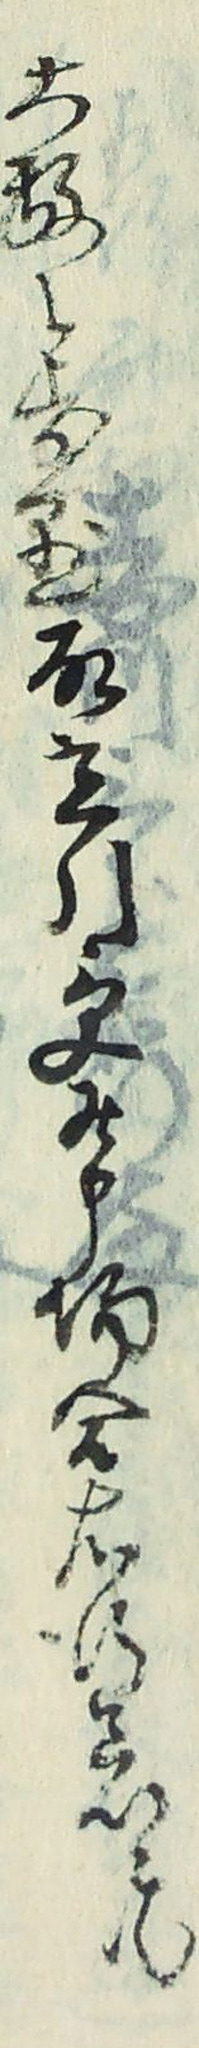大数之歩懸取立引受居申場合右行着ニも
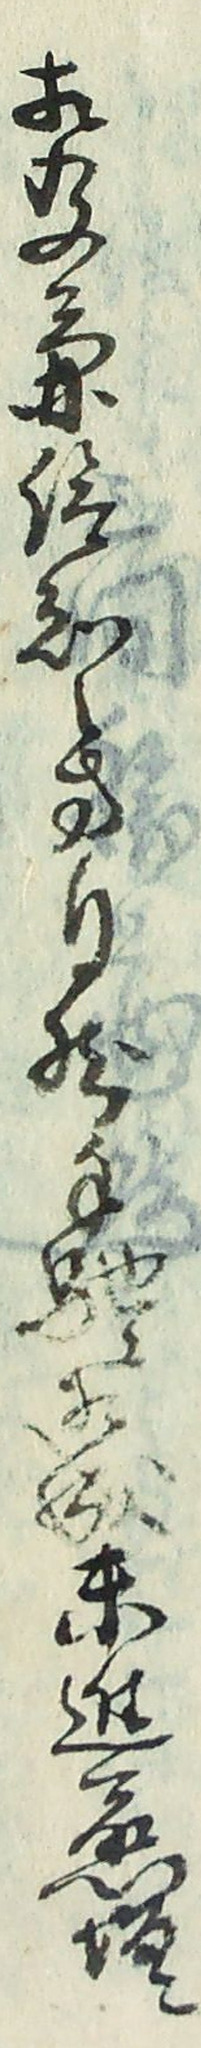相及兼給知之方自然手弛ニ相成未進愈増
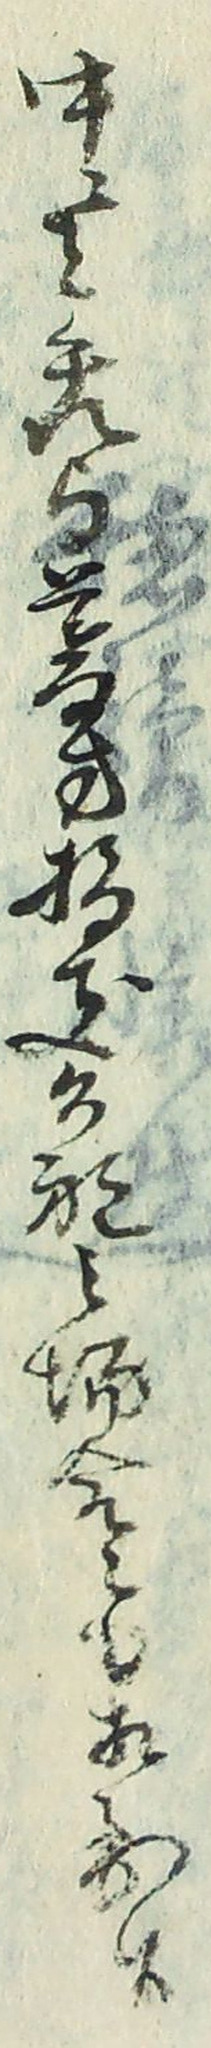中ニ者犇と暮方指支候程之場合ニも相到候
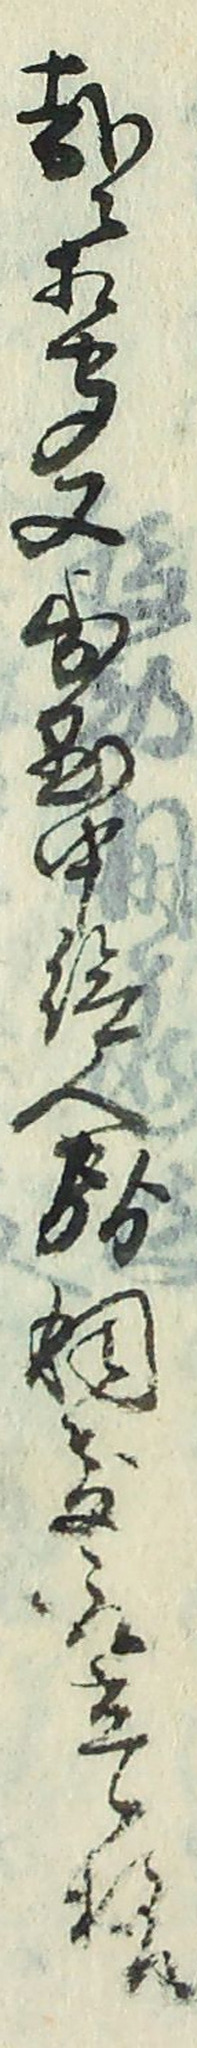哉ニ相聞又歩懸中給人ゟ稠敷取立候様
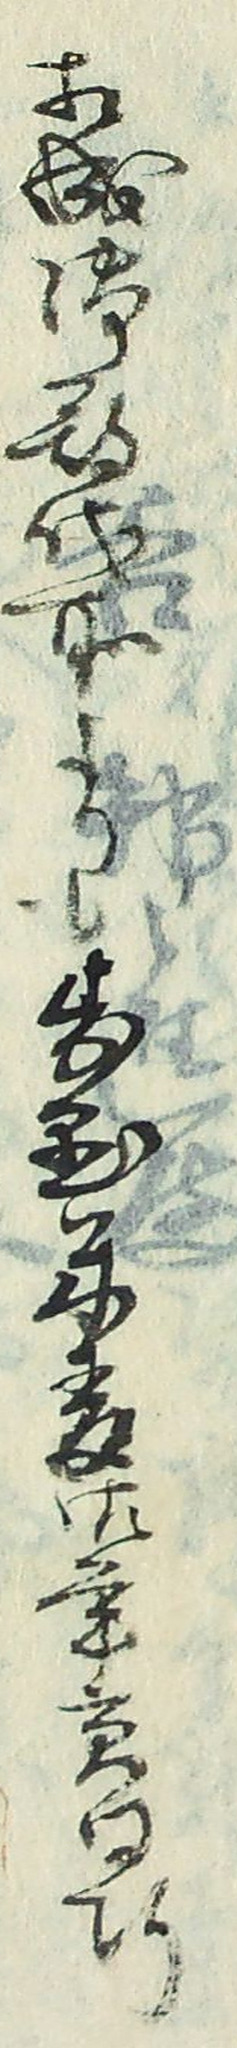相成御郡代所よりも歩懸米麦御年貢同断
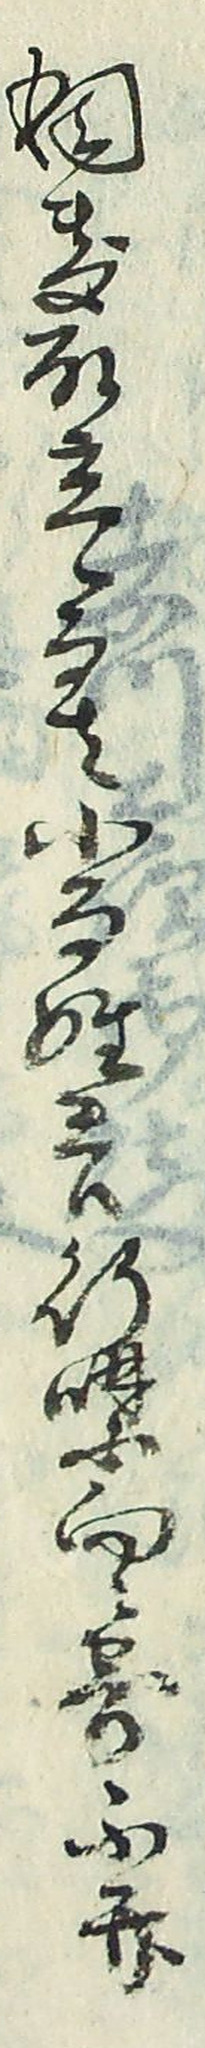稠敷取立候而者小百姓共行噤向ニ寄不弁
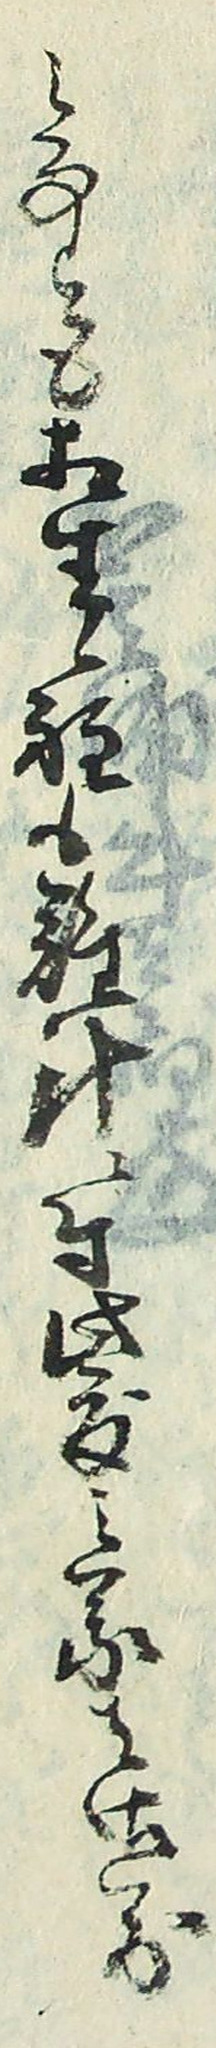之事とも相生候程も難計ニ付此度之義者御別
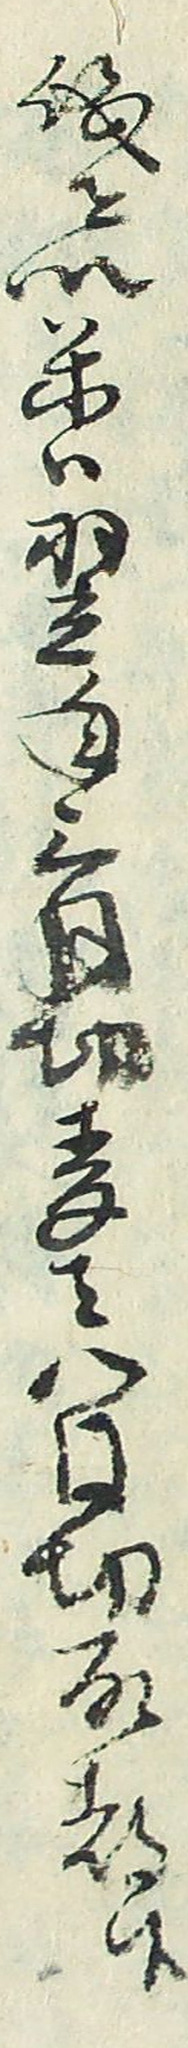儀を以米ハ翌年三月切麦者八月切取都候

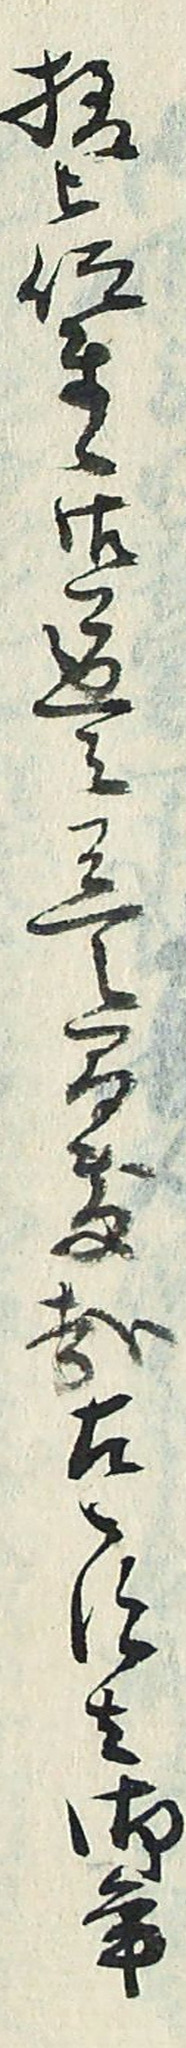様被仰付候御道者有之間敷哉左候得者御年
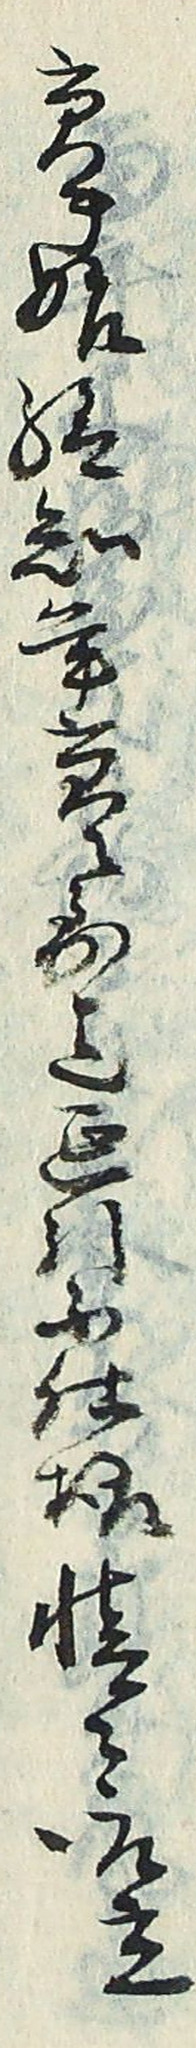貢ヲ始給知年貢ニ到迄延引不仕様情々取立
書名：諸御趣意書并御下知向之写
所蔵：鳴門教育大学 Naruto University of Education
